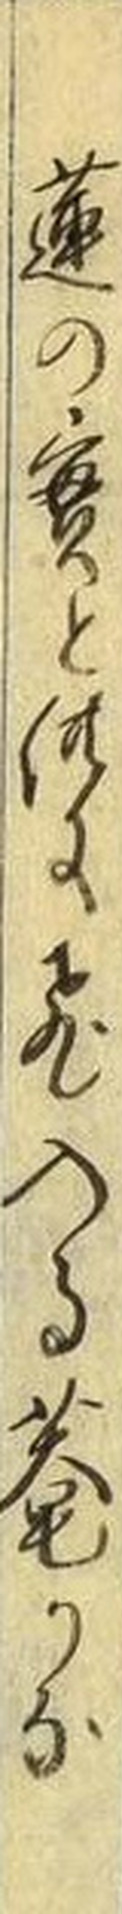蓮の実と供に飛入る菴かな
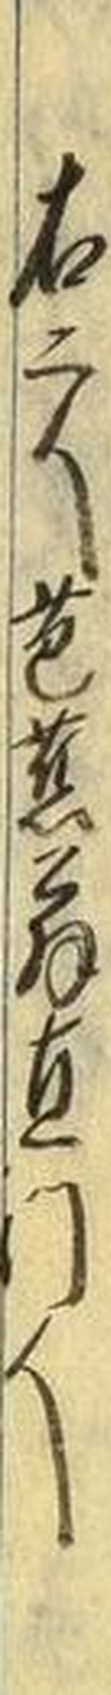右二人芭蕉翁直同人

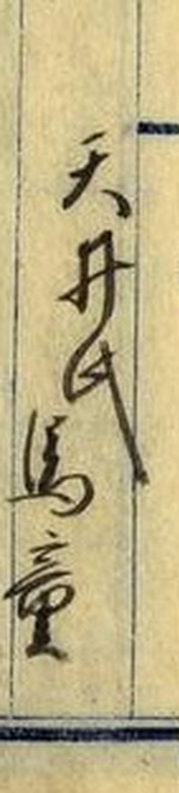天井氏馬童
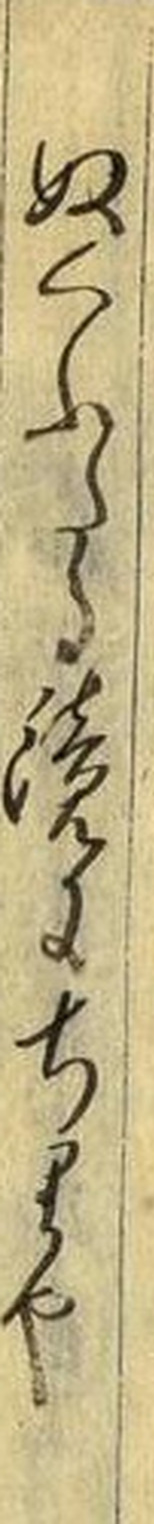ぬくふたる鏡にちりや
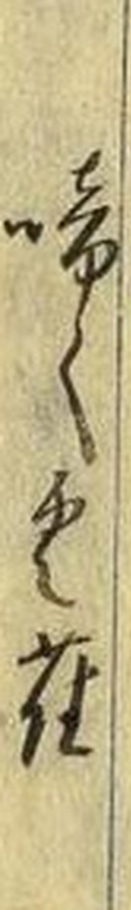啼く雲雀
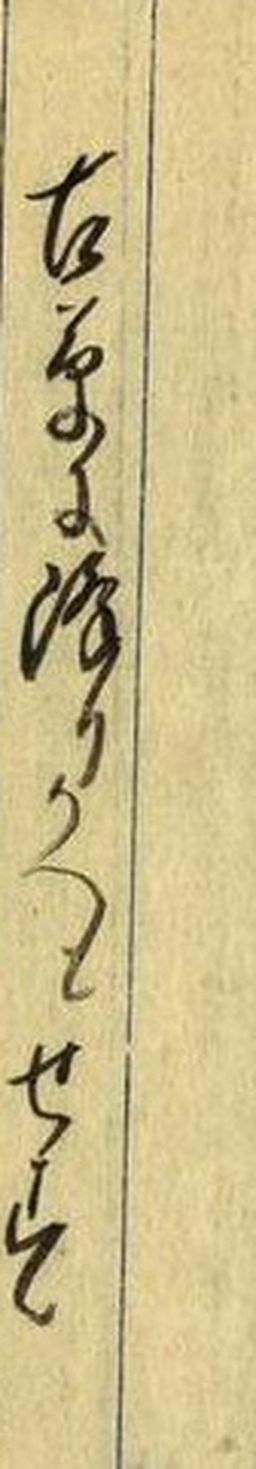古草に降りかへもせす雪雫
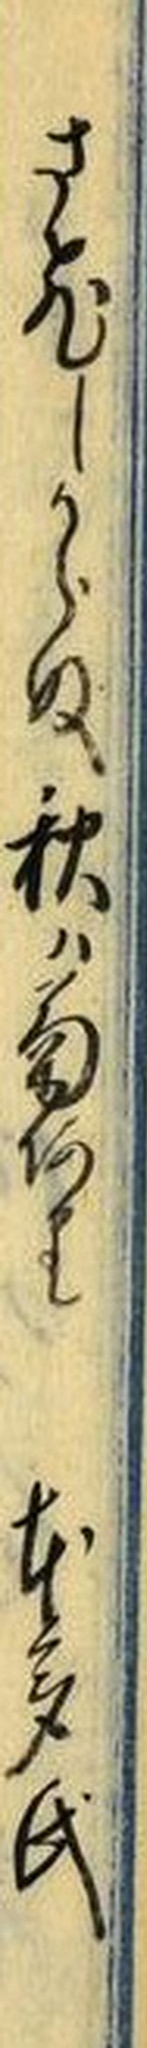さひしからぬ秋は菊あり本多氏
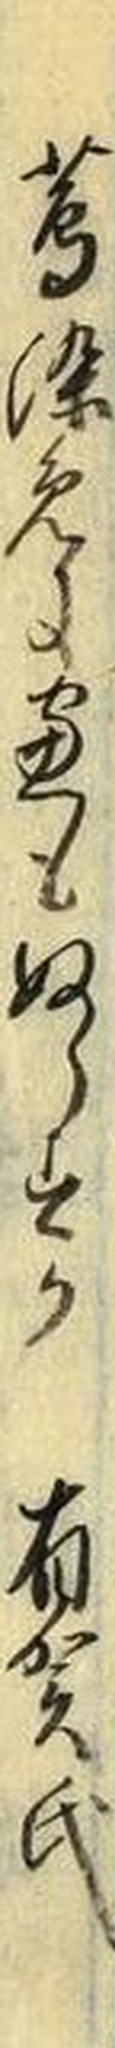蔦染めに窓もぬらすか有賀氏
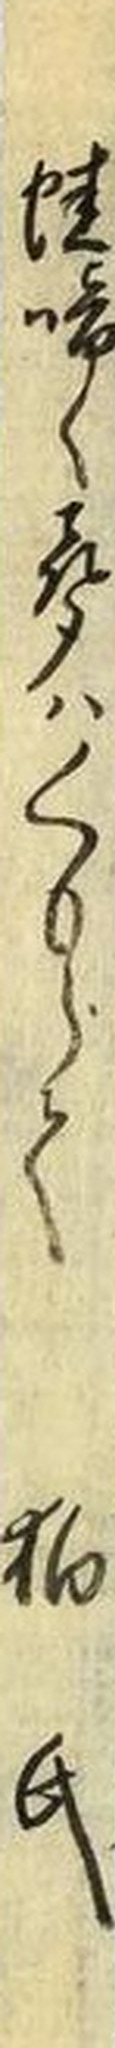蛙啼く声はくもらて狛氏
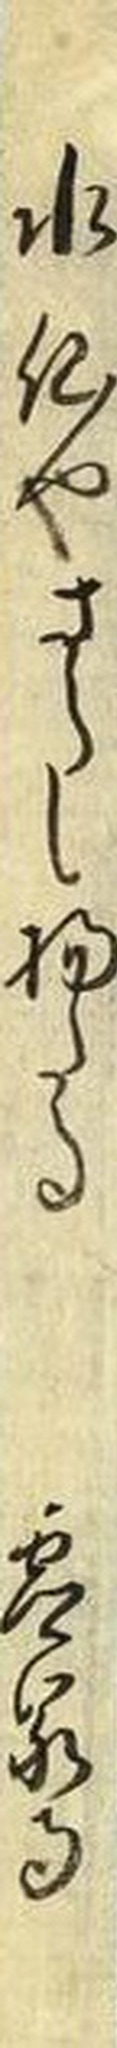水仏やさらし物たる霊泉寺
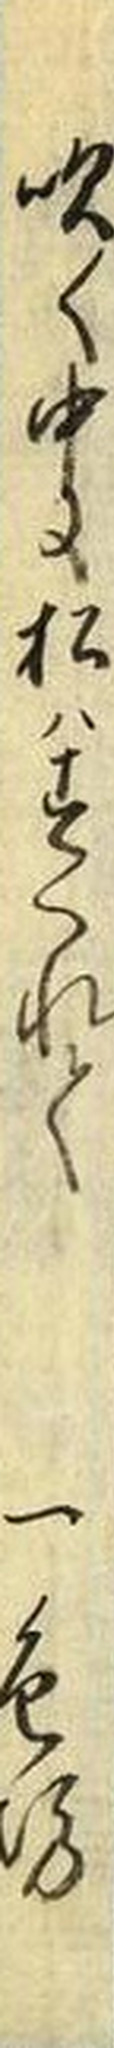吹く中に松はすくれて一色坊
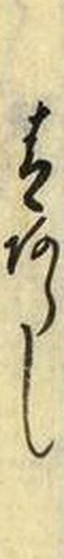青あらし

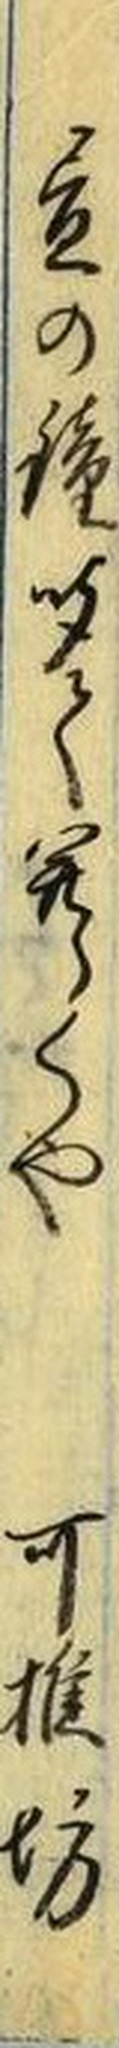昼の鐘聞て開らくや可推坊
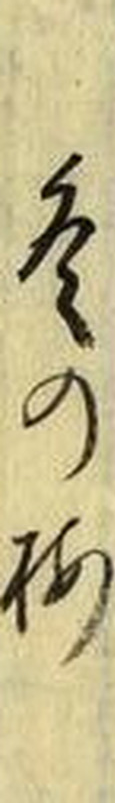冬の梅
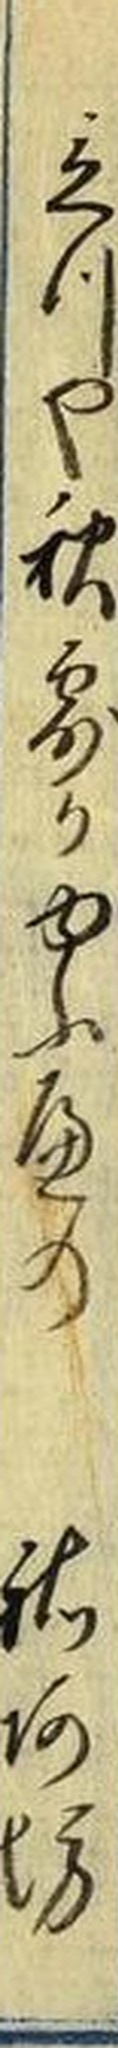立川や秋露かゆふへの祐阿坊
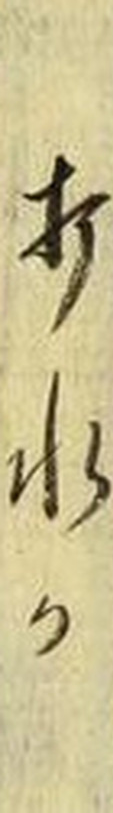打水か
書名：温古集 三巻
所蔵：福井県文書館 Fukui Prefectural Archives
